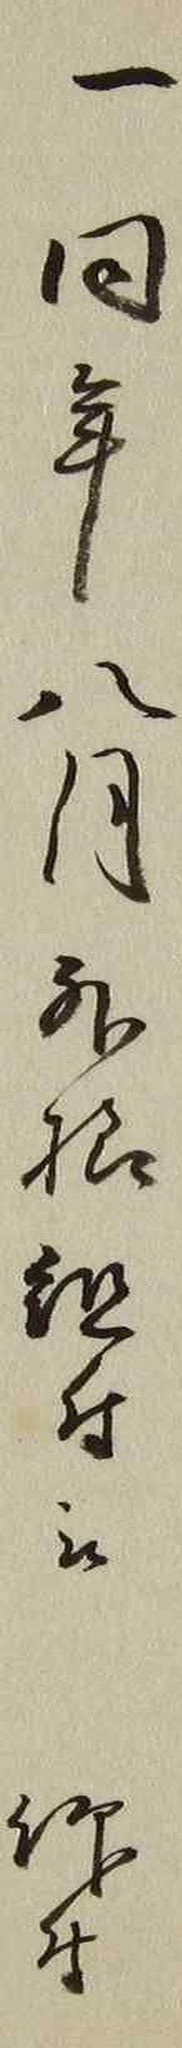一同年八月外様組付被仰付
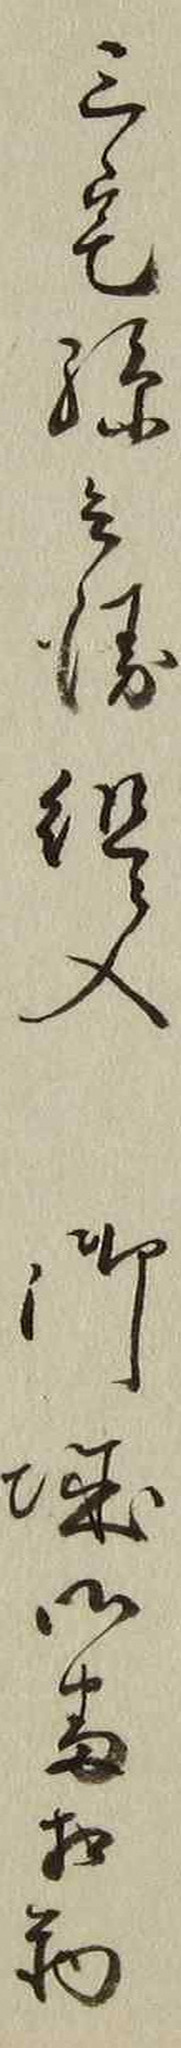三宅孫兵衛組に入御城御番相勤
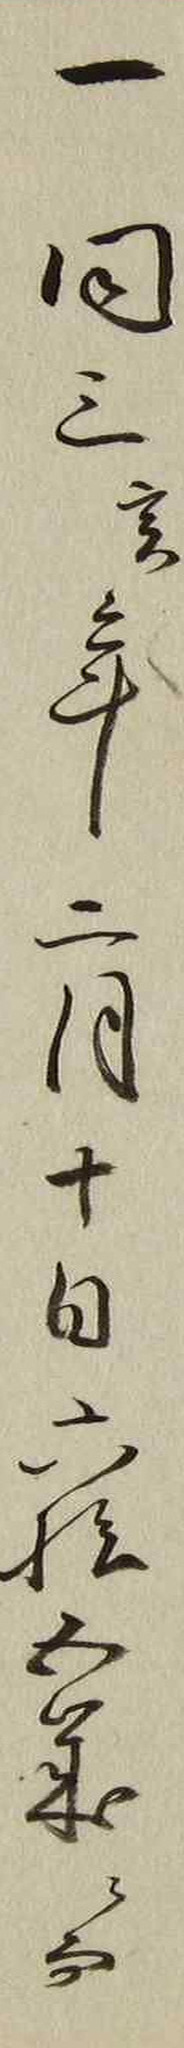一同三亥年二月十日六拾五歳に而
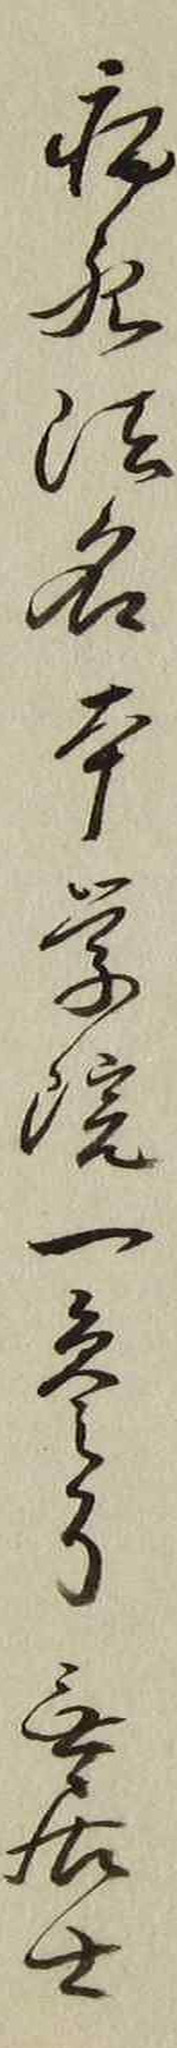病死法名奉学院一員之了無居士

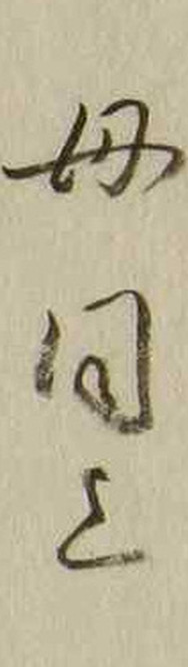母同上
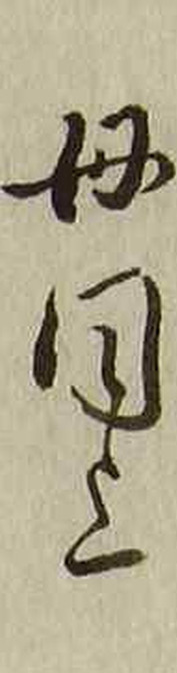母同上
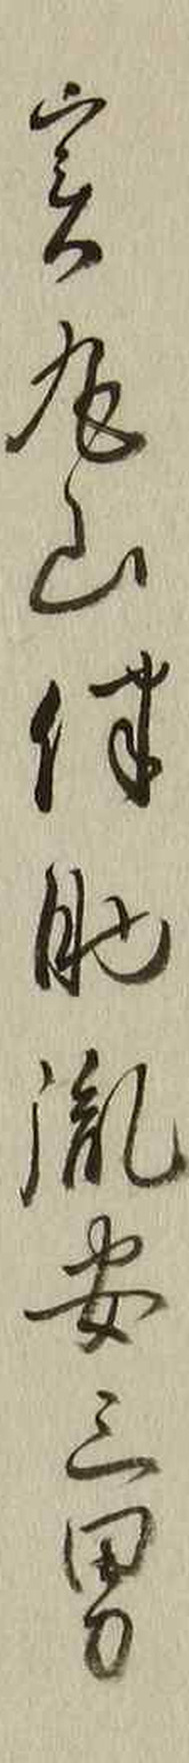実丸山伴助胤安三男
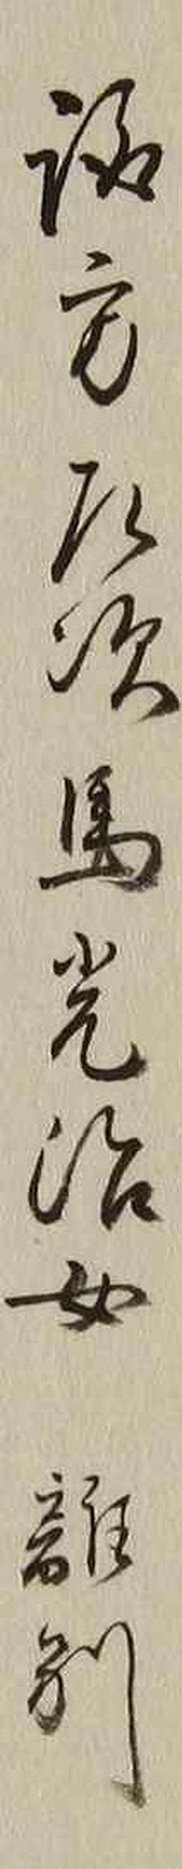諏方左次馬光治女離別
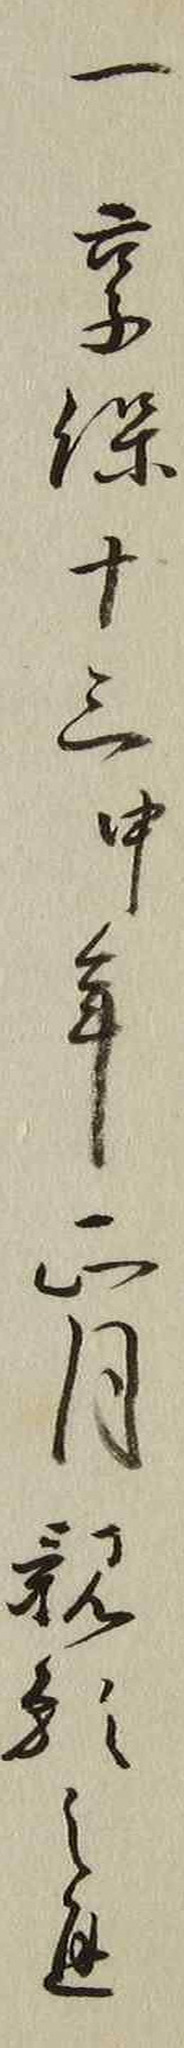一享保十三申年正月親願之通
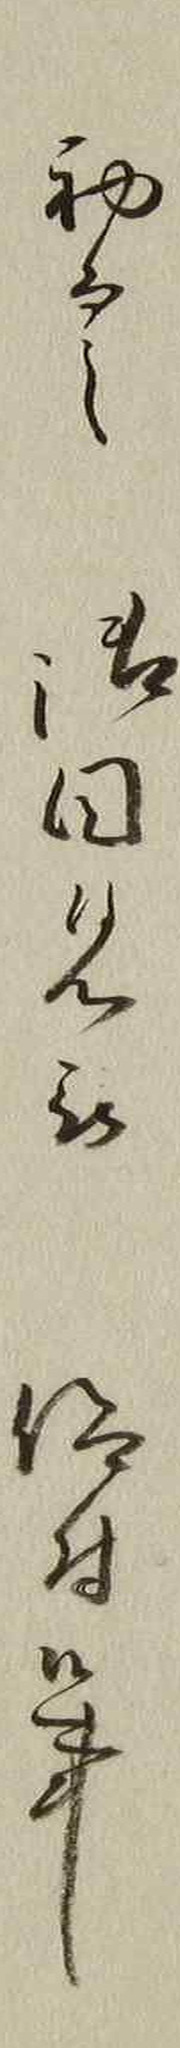初而之御目見被仰付候事
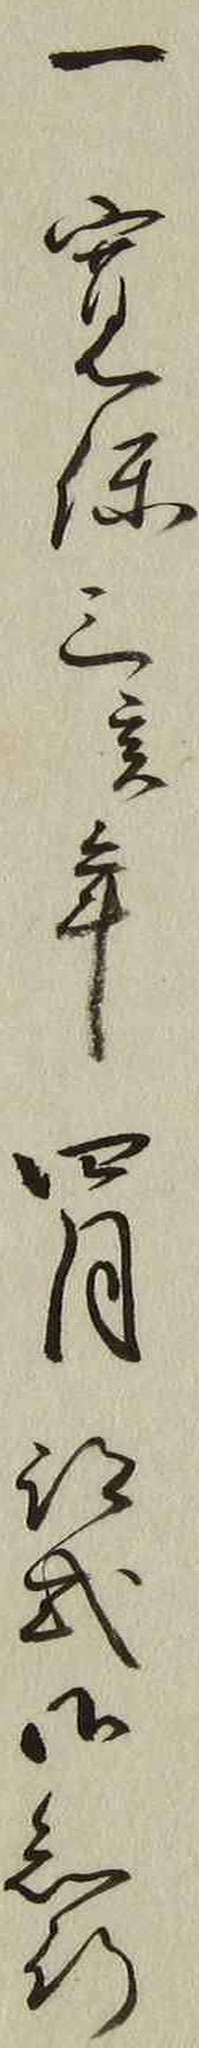一寛保三亥年四月跡式御知行
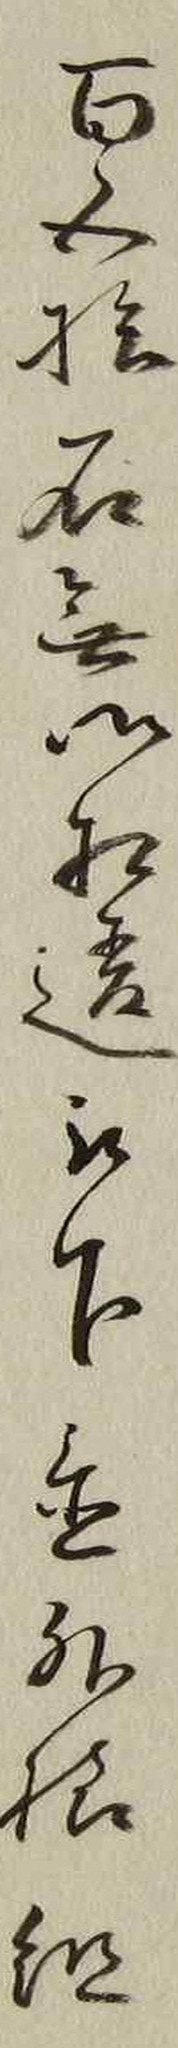百五拾石無御相違被下置外様組
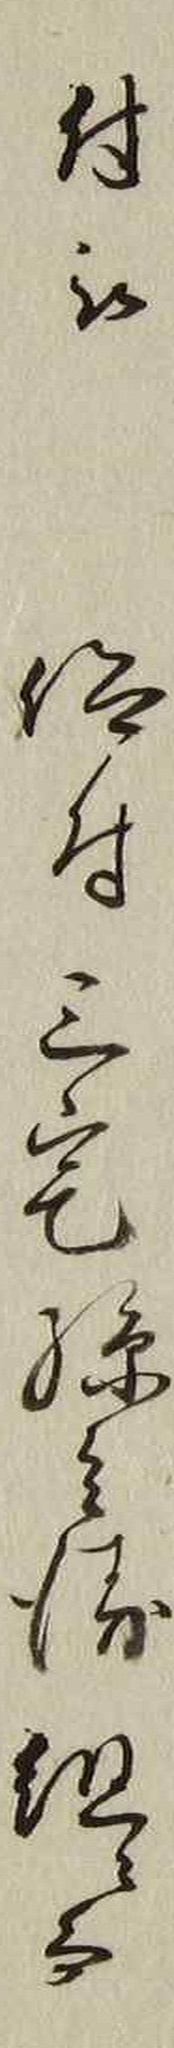付被仰付三宅孫兵衛組に而
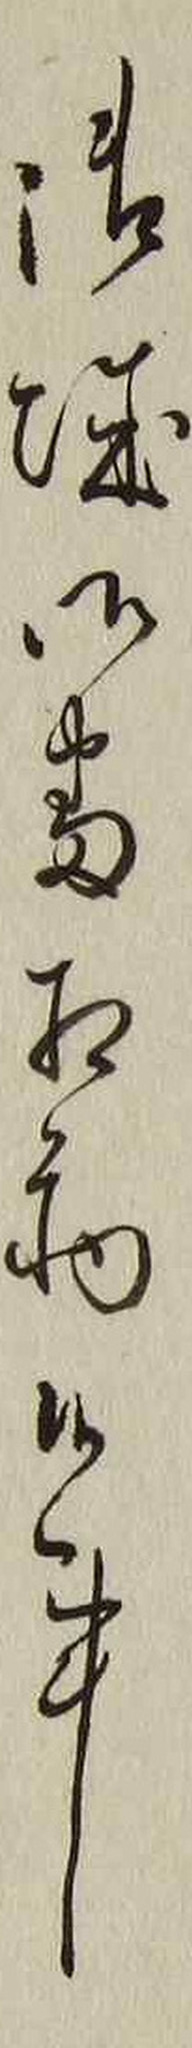御城御番相勤候事
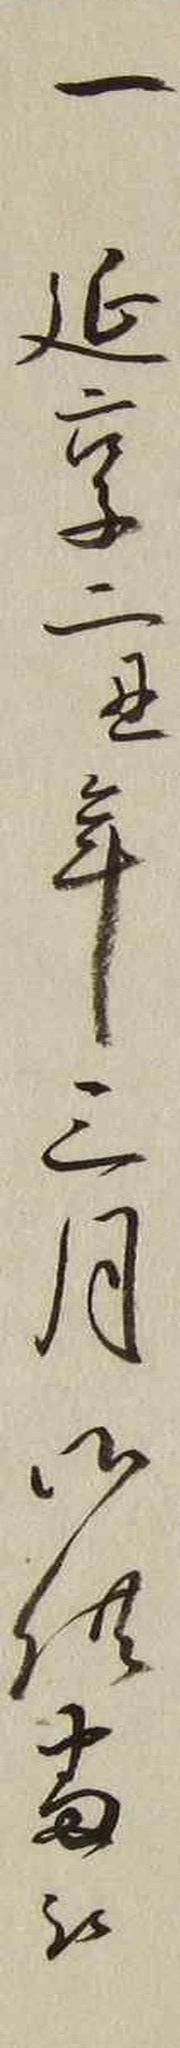一延享二丑年三月御供番被
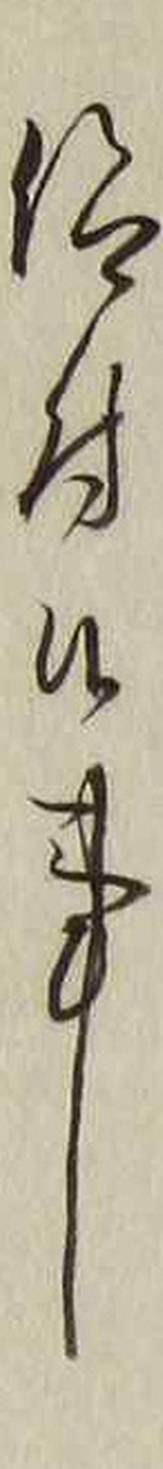仰付候事
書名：諸士系譜　巻之6　い之部6
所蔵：会津若松市立会津図書館
